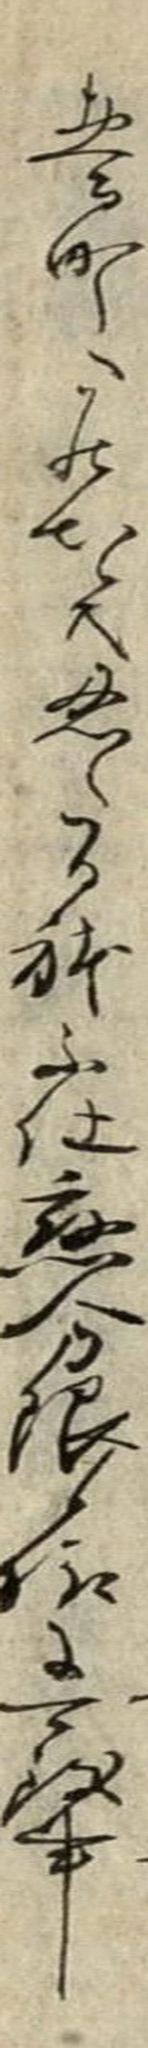惣て町へ罷出候共忍たる体不仕応分限候様に可致事
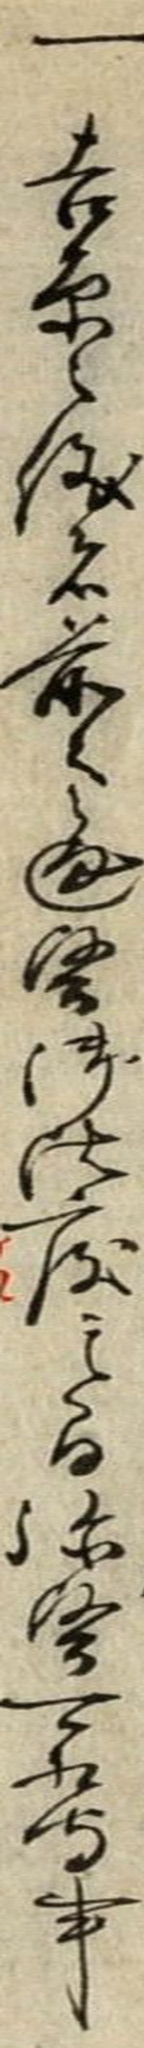一吉原之儀は前々之通堅御法度に候間弥堅可相守事
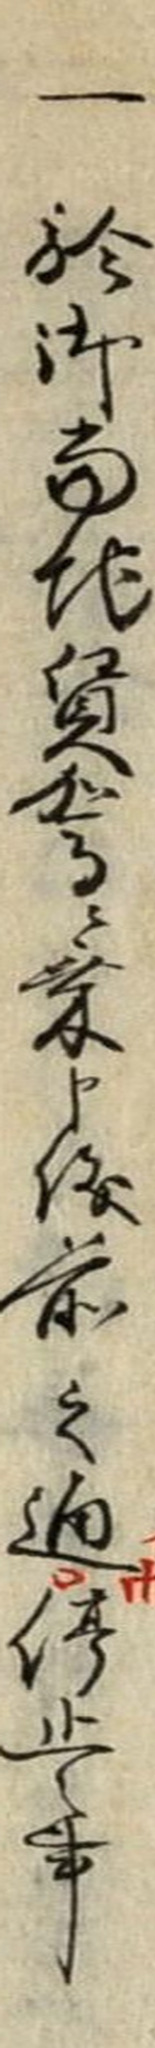一於御当地賃駕に乗申儀前之通停止之事
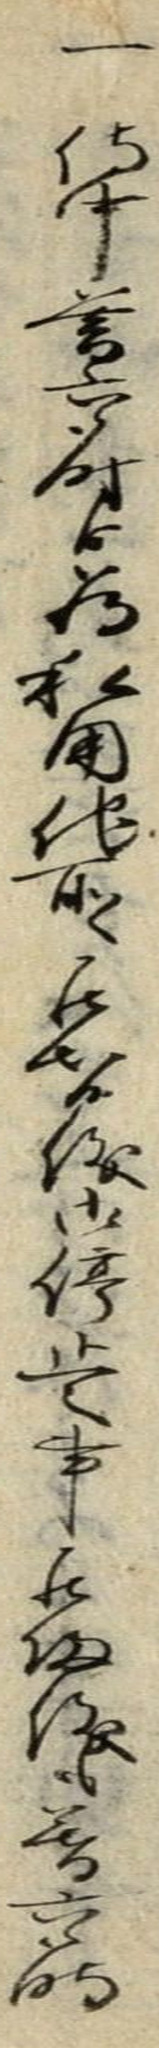一侍中暮六ツ時ゟ為私用他所へ罷出候儀御停止之事罷帰儀も暮六ツ時
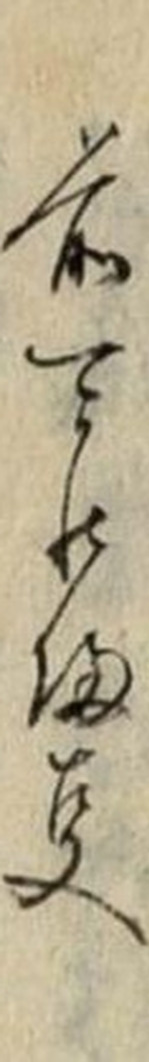前可罷帰事
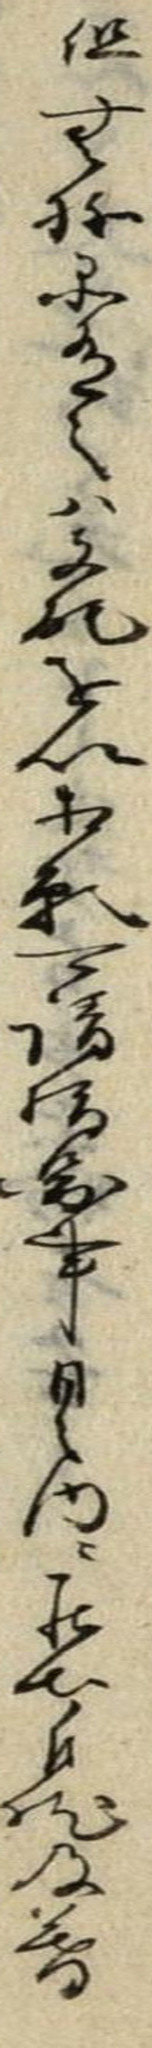但無據品有之は支配を以相頼可請指図事日之内に罷出自然及暮
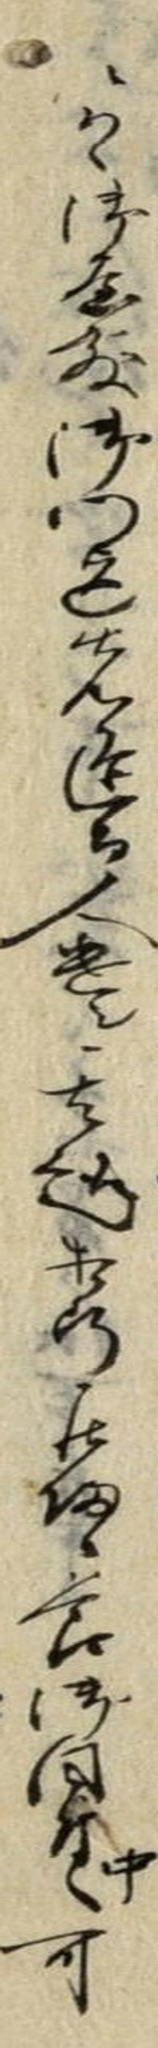候はゝ御屋敷御門迄先達て人遣し其趣相断罷帰候節御目付中へ可
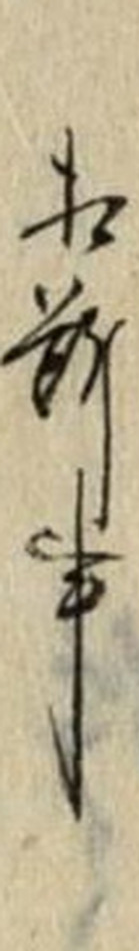相断事
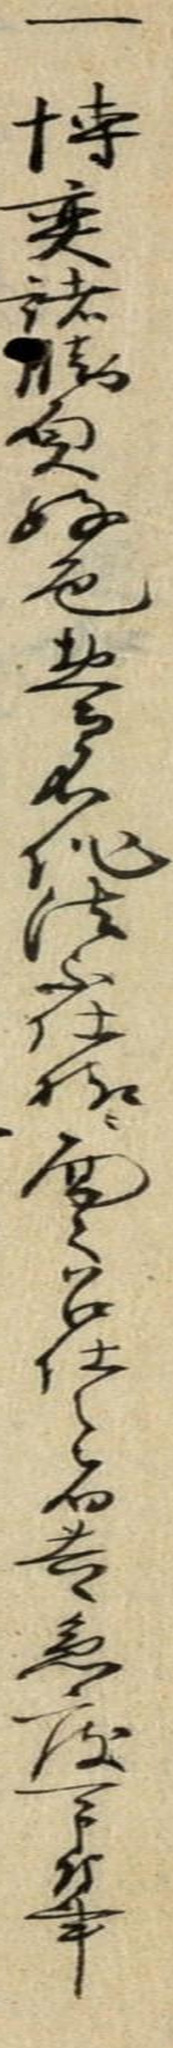一博打諸請負好色惣て無作法不仕様に面々召仕之者共へ急度可申付事
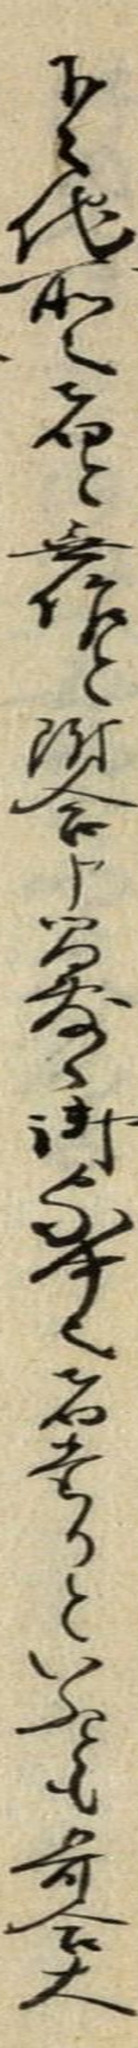一下々他所の者と無作と附合申間敷候御家中之者たりといふとも寄合大
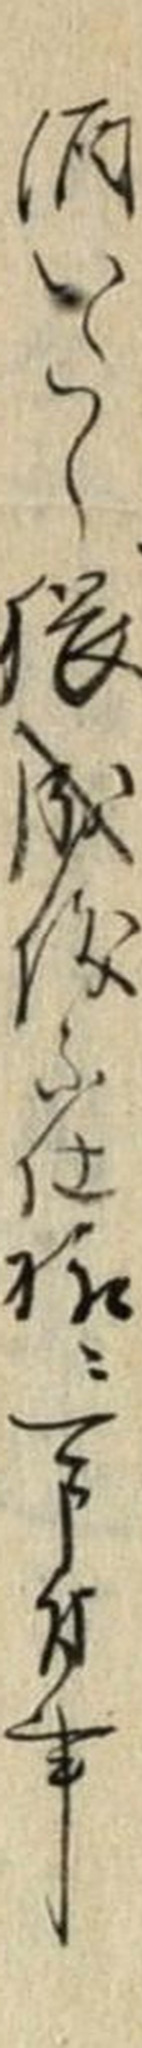酒いたし猥成儀不仕様に可申付事
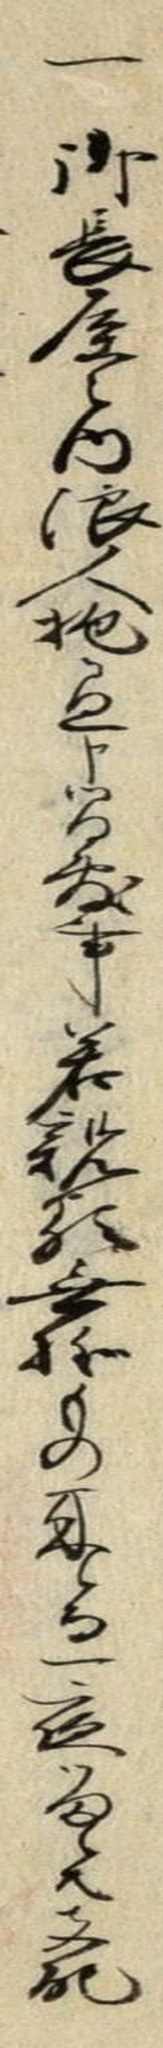一御長屋之内浪人抱置間敷事若親類無據もの来候て一夜留候共支配
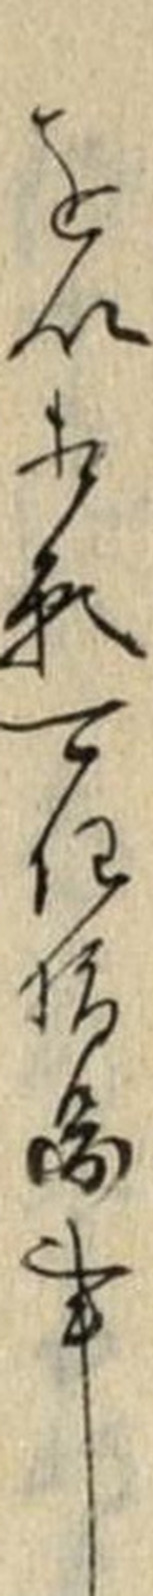を以相頼可任指図事
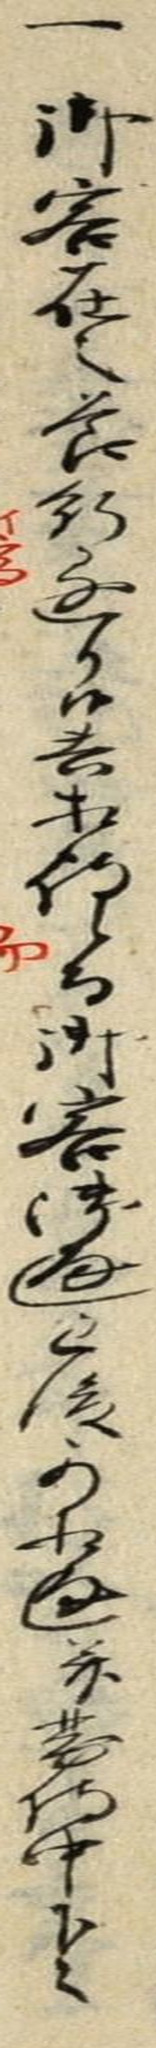一御客在之節行懸り候共相待候て御客御通已後可相通幷番侍中下々
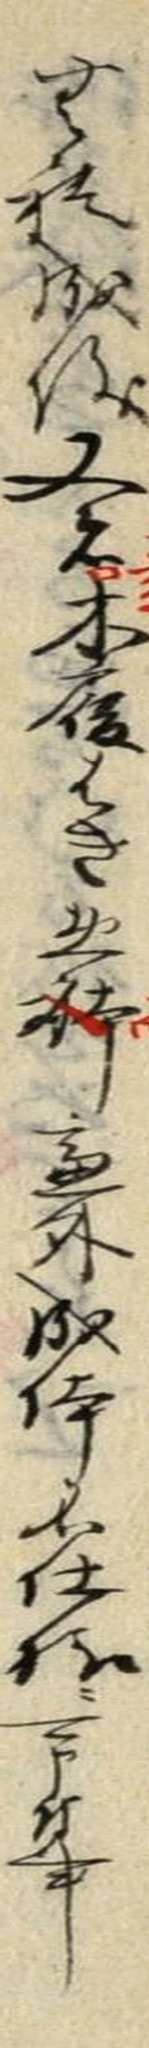無礼成儀又は木履はき惣慮外成体不仕様に可申付事
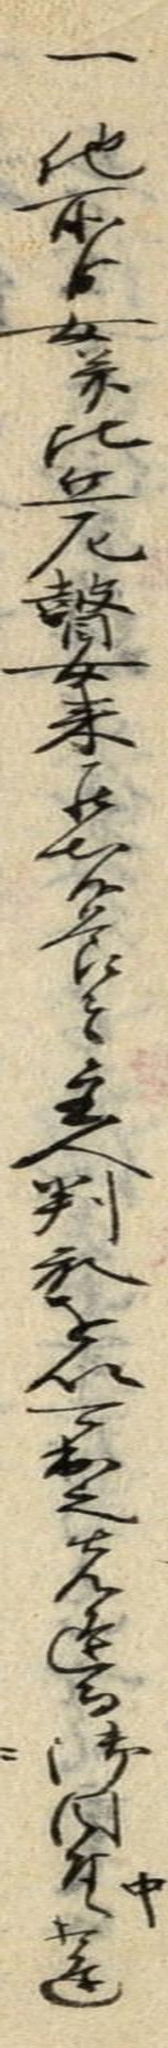一他所ゟ女幷比丘尼瞽女来罷出候節は主人判形を以可出也先達而御目付中へ相達
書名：三都并道中之部
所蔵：福井県文書館 Fukui Prefectural Archives
